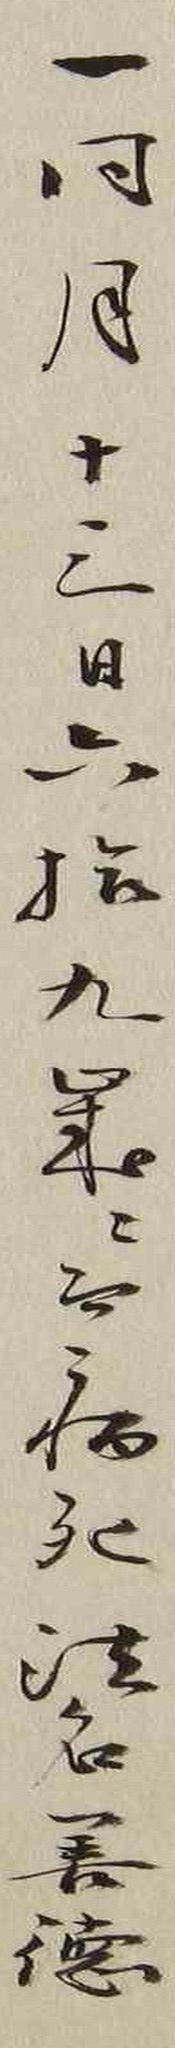一同月十三日六拾九歳に而病死法名善徳
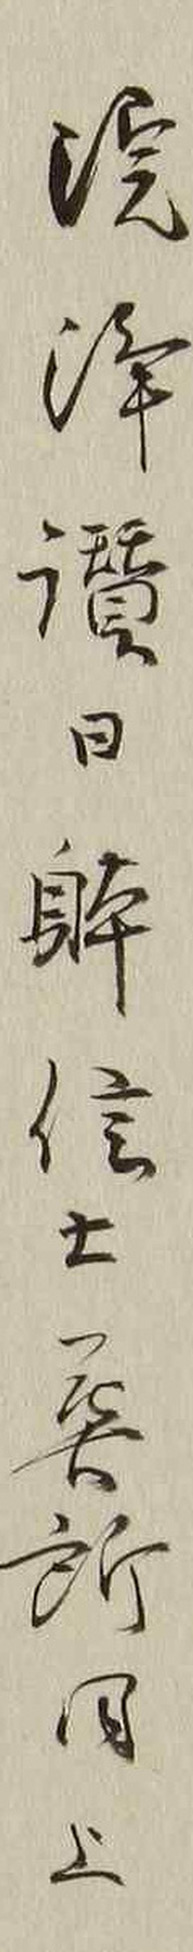院浄讃日体信士葬所同上
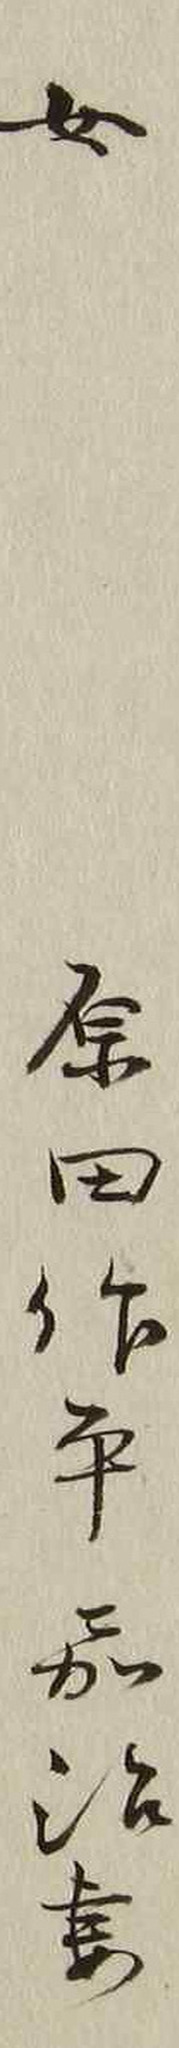女原田作平嘉治妻
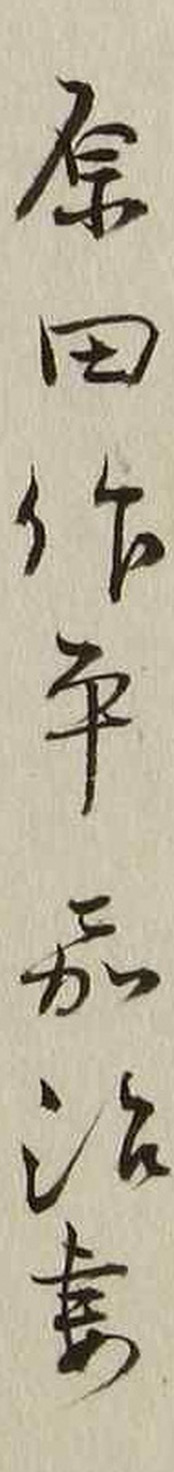女原田作平嘉治妻
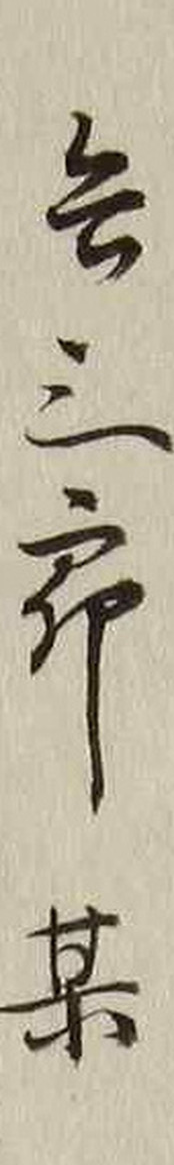兵三郎某
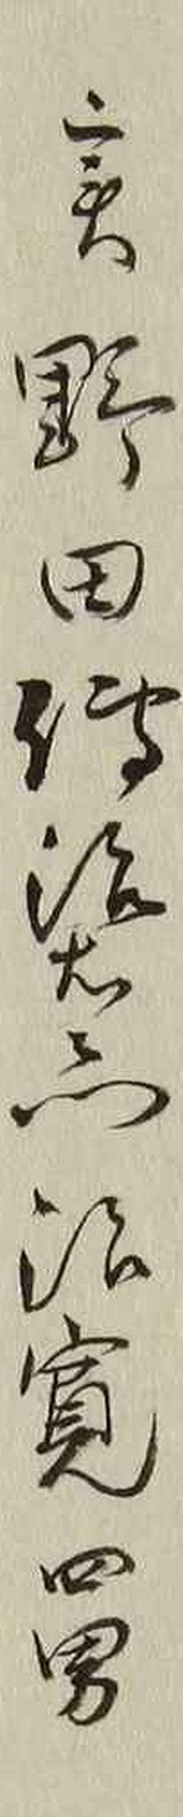実野田伝治右衛門治寛四男
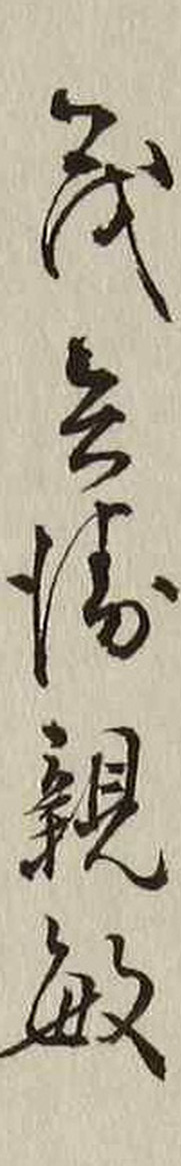茂兵衛親敏
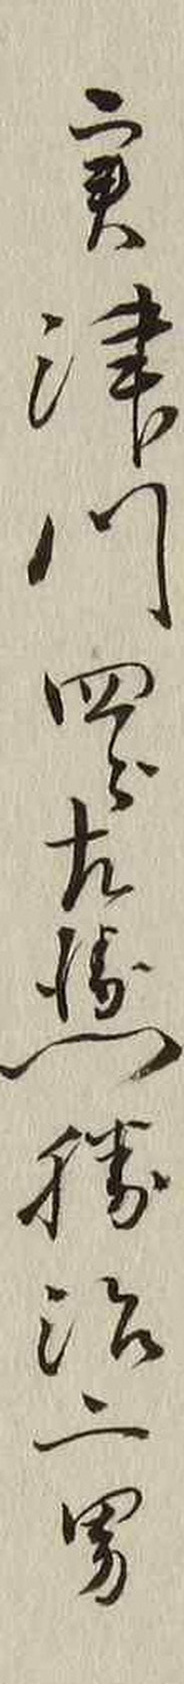実津川四郎左衛門勝治二男
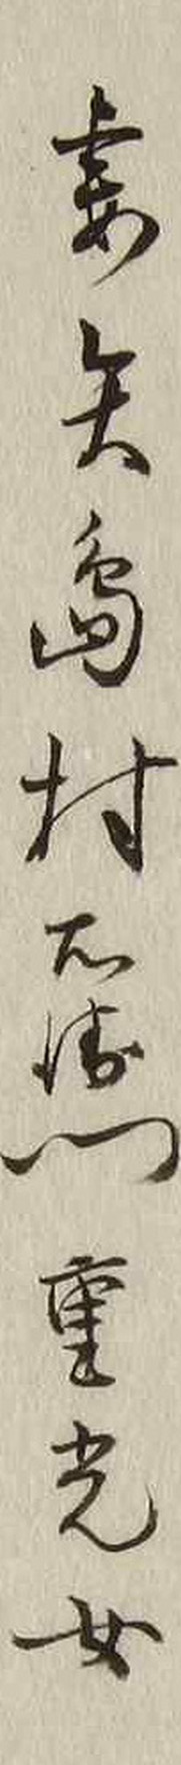妻矢島村右衛門重光女
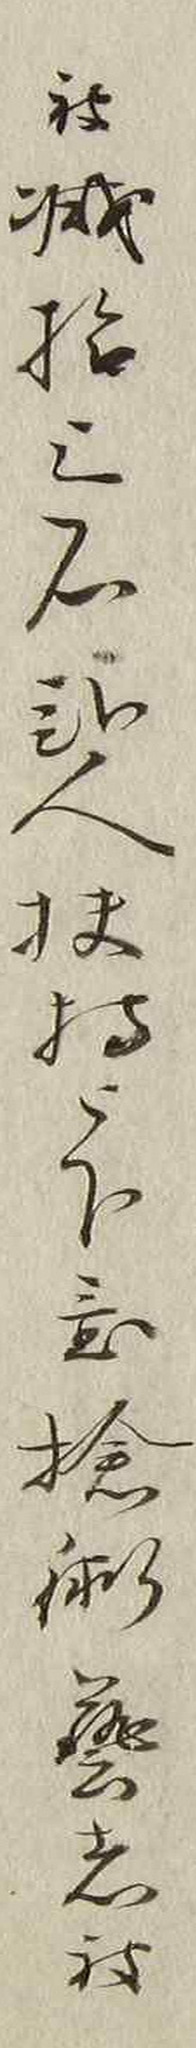被減拾三石弐人扶持被下置槍術芸者被
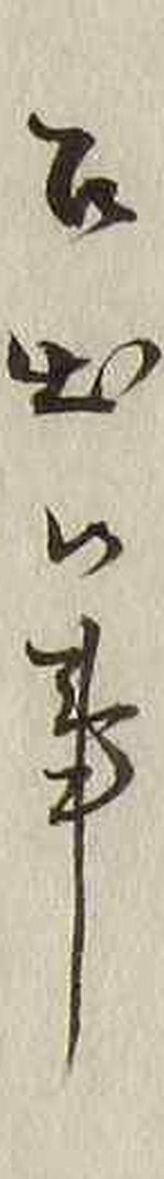召出候事
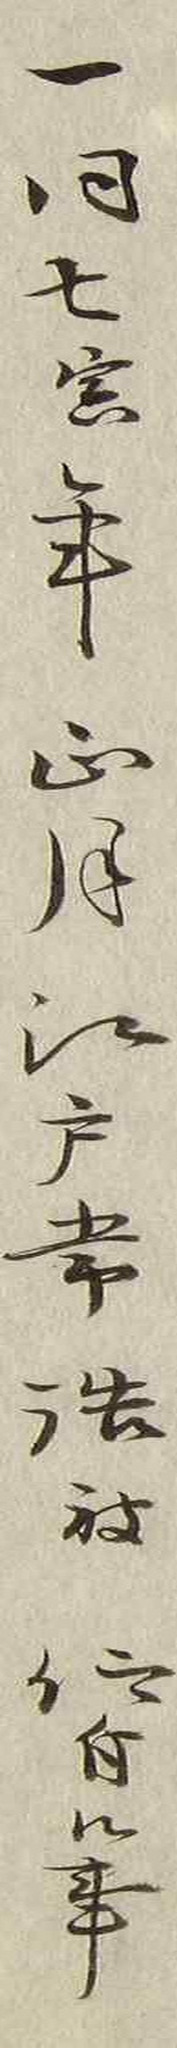一同七寅年正月江戸常詰被仰付候事
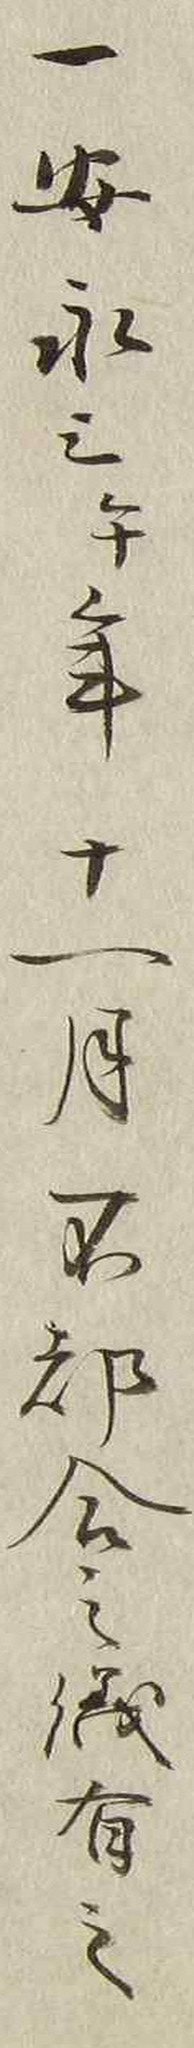一安永三午年十一月不都合之儀有之
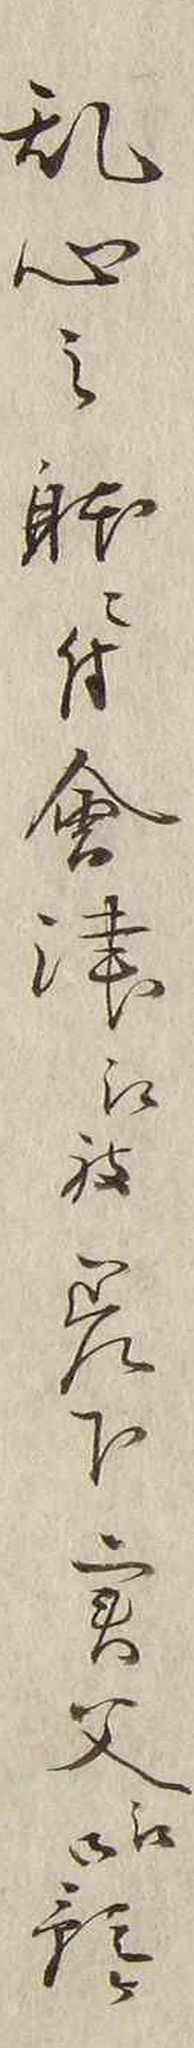乱心之体に付会津え被差下実父え御預け

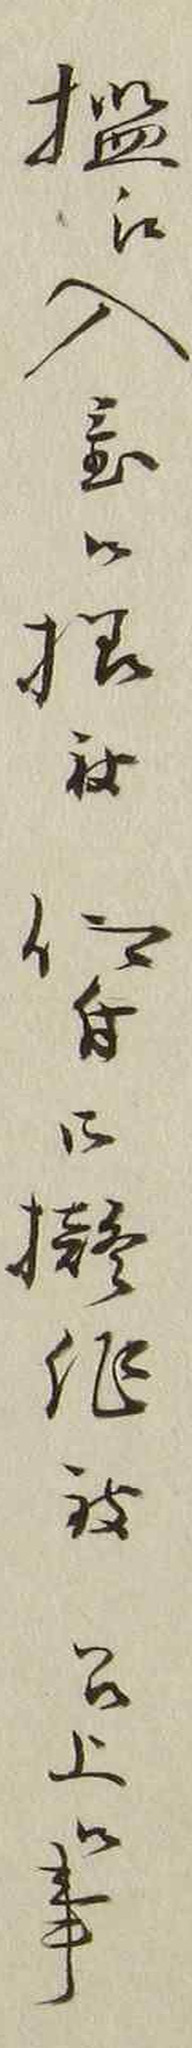檻え入置候様被仰付御擬作被召上候事
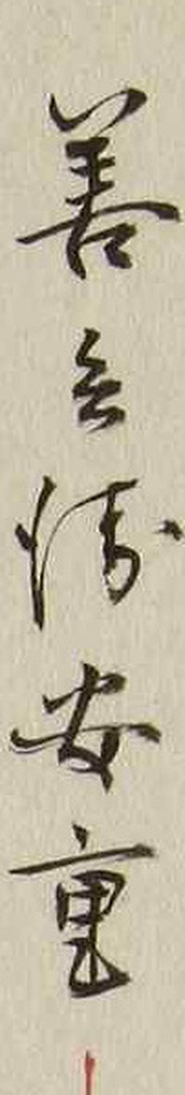善兵衛安重
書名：諸士系譜　巻之157　ね之部1
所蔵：会津若松市立会津図書館
